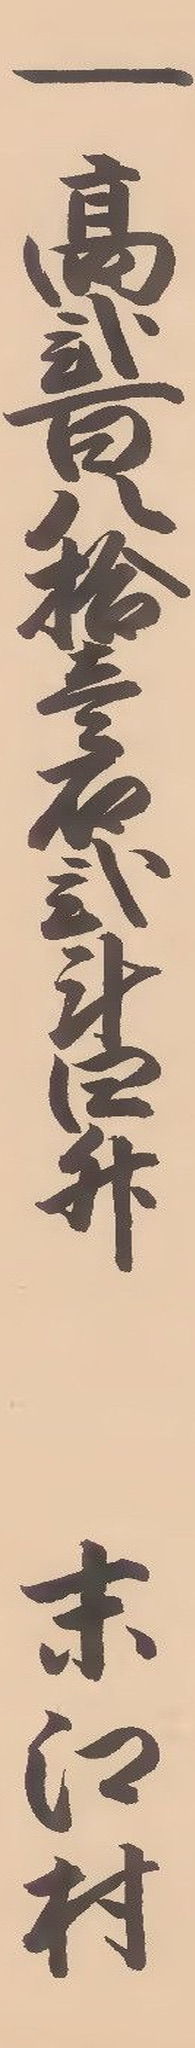一髙弐百八拾壱石弐斗四升末江村

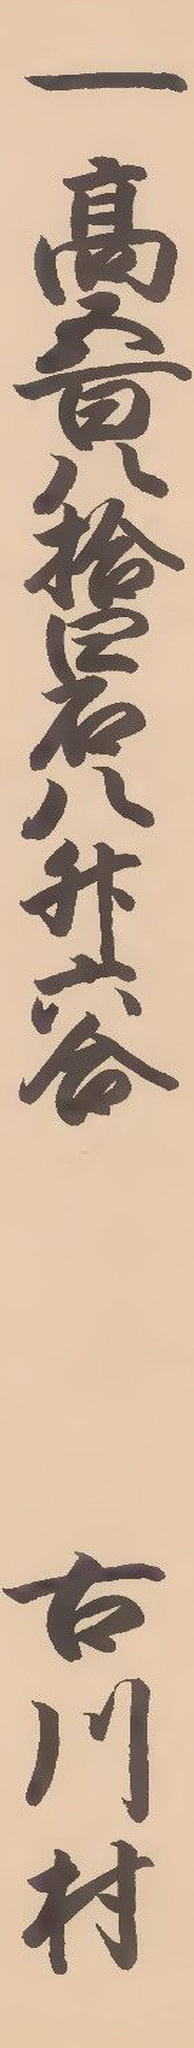一髙五百八拾四石八升六合古川村
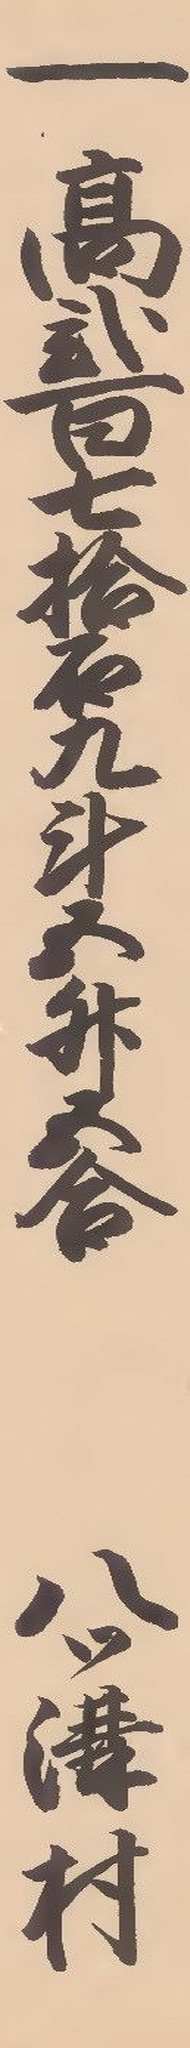一髙弐百七拾石九斗五升五合八ツ溝村
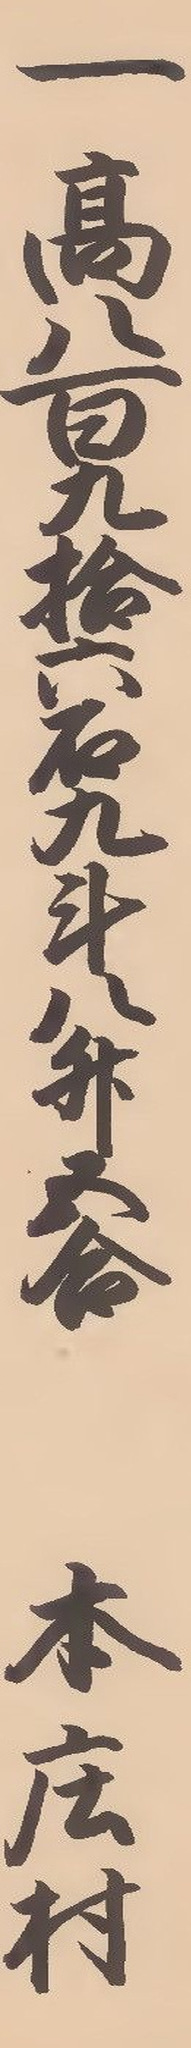一髙八百九拾六石九斗八升五合本庄村
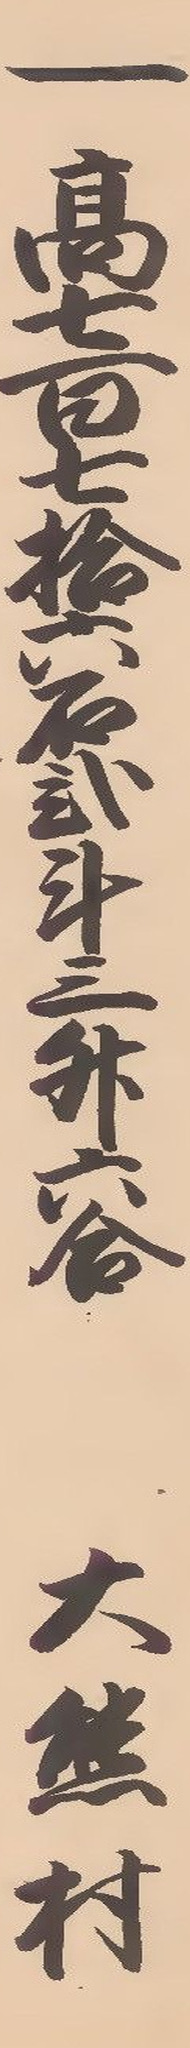一高七百七拾六石弐斗三升六合大熊村
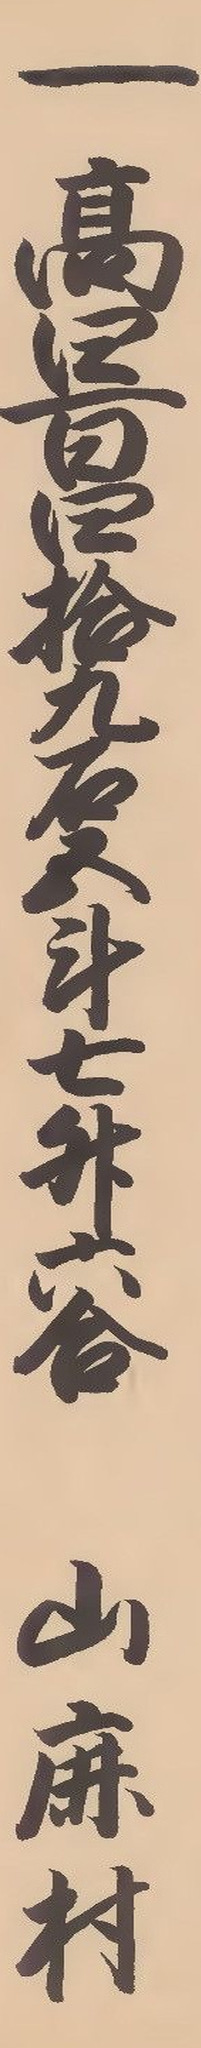一髙四百四拾九石五斗七升六合山鹿村
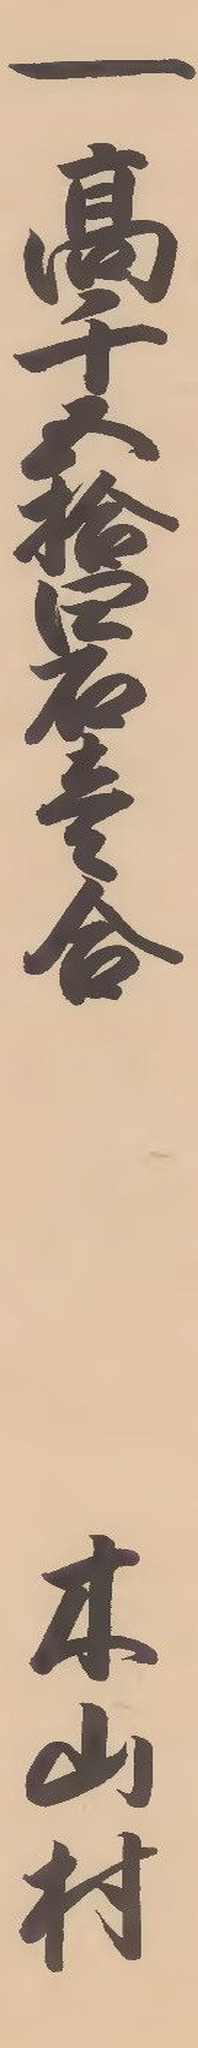一髙千五拾四石壱合木山村
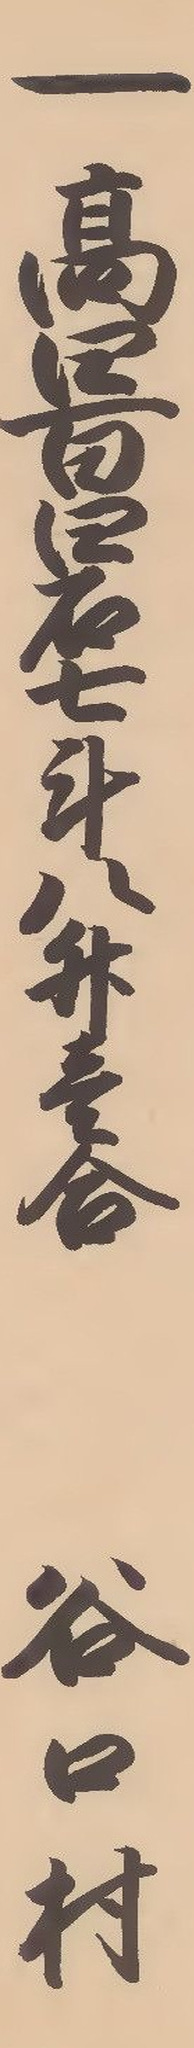一髙四百四石七斗八升壱合谷口村
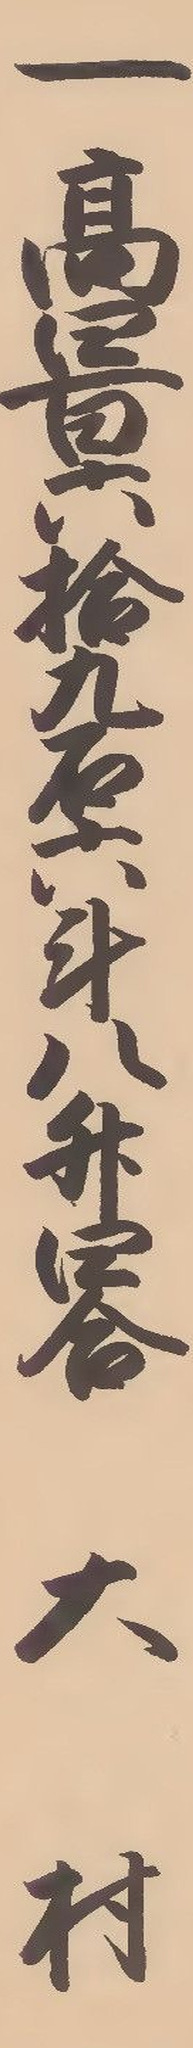一髙四百六拾九石六斗八升四合大村

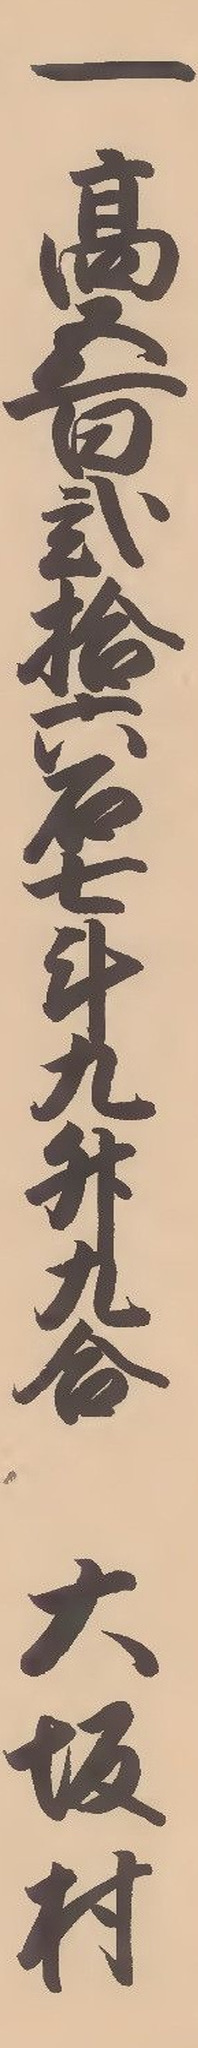一髙五百弐拾六石七斗九升九合大坂村
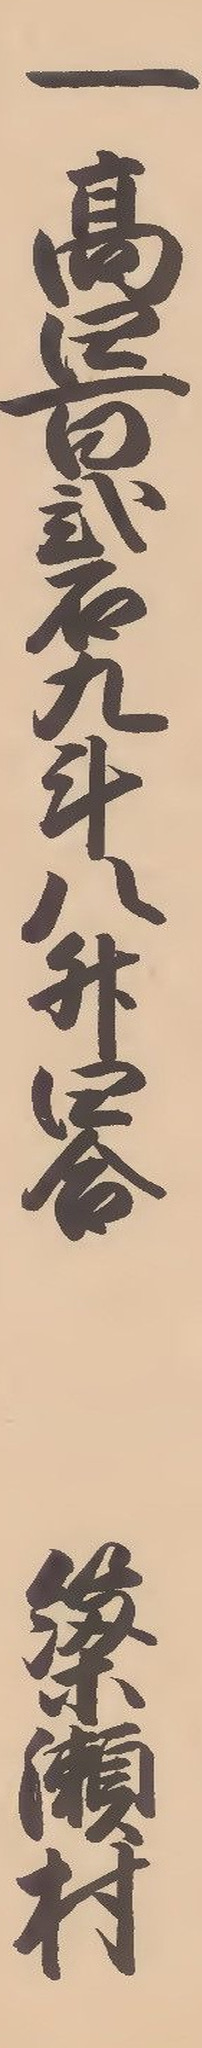一髙四百弐石九斗八升四合簗瀬村
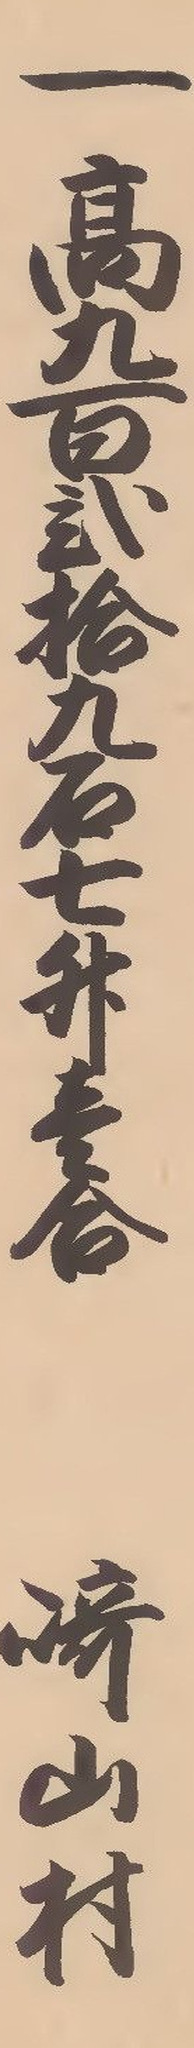一髙九百弐拾九石七升壱合崎山村
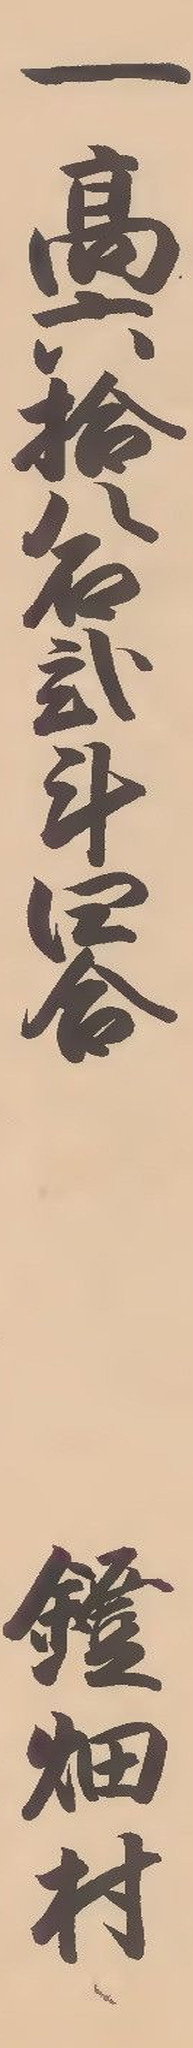一髙六拾八石弐斗四合鐙畑村
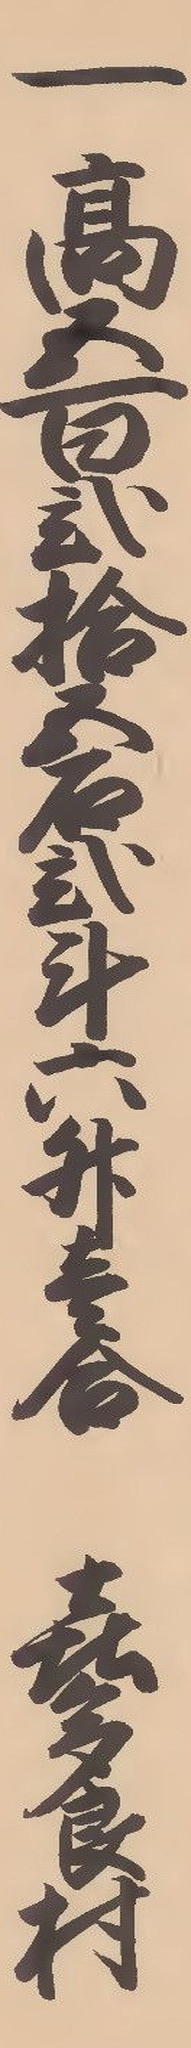一髙五百弐拾五石弐斗六升壱合喜多良村
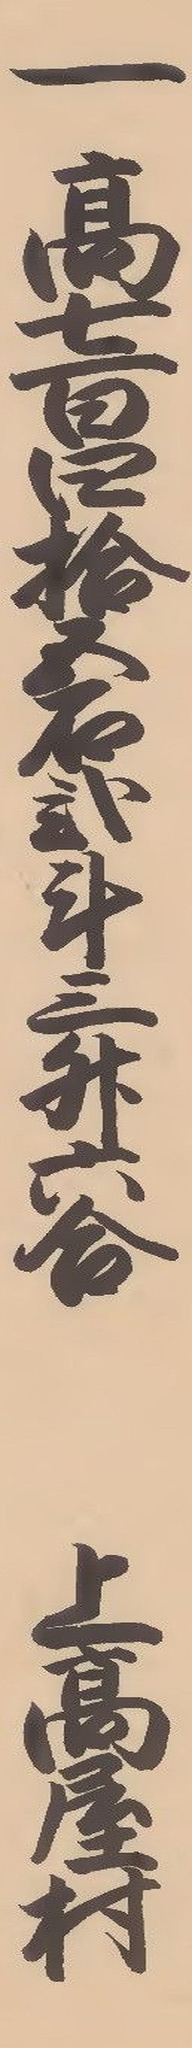一高七百四拾五石弐斗三升六合上髙屋村
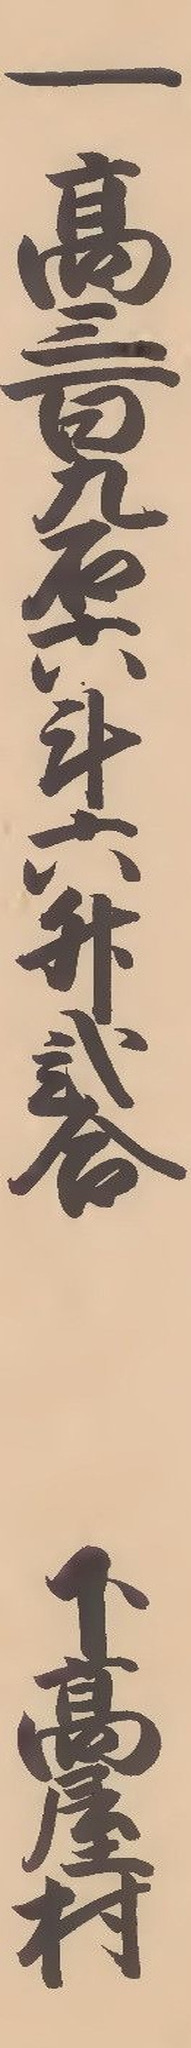一高三百九石六斗六升弐合下髙屋村
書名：豊前国郷帳
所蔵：国立公文書館 National Archives of Japan
